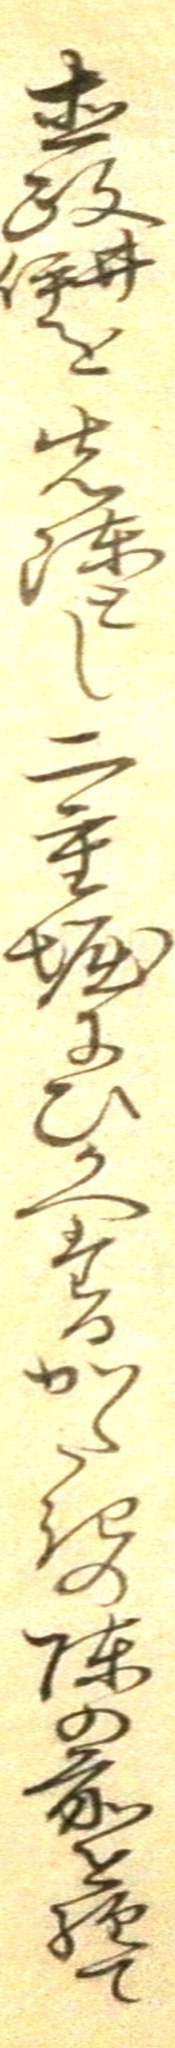直政井伊を先陣とし二重堀にひかへたるかたきの陣の前を経て
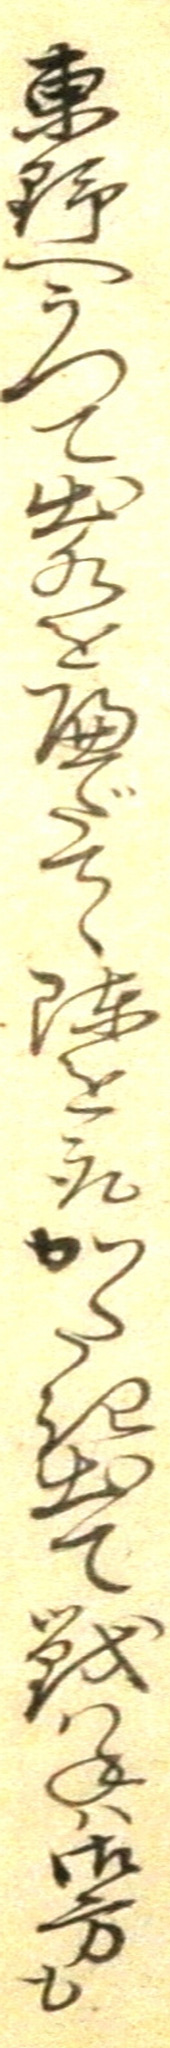東野へうつて出水をへだてゝ陣を取かたき出て戦はねは御方も
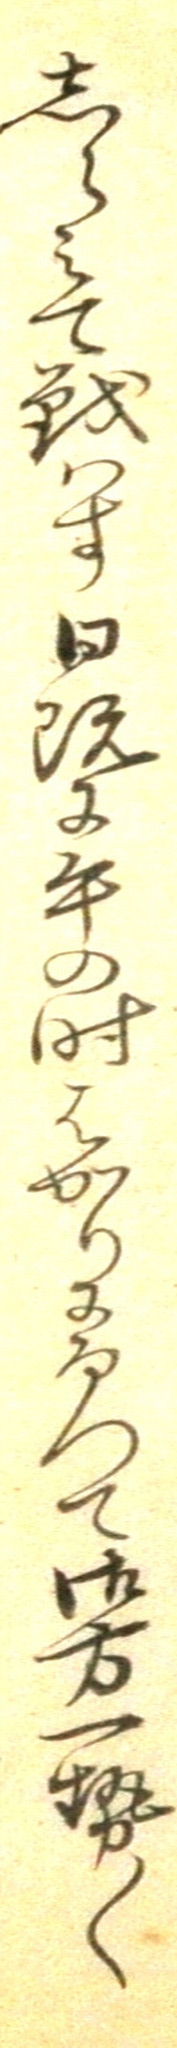しらみて戦はす日既に午の時はかりになつて御方一勢〳〵
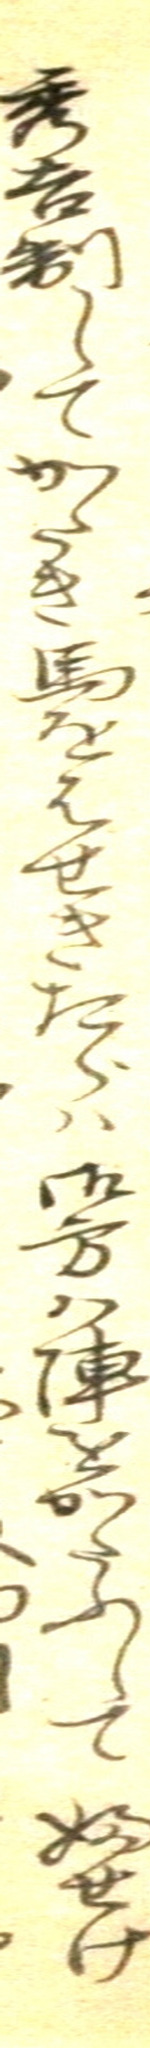秀吉制してかたき馬をはせきたらは御方は陣をかたふしてふせけ
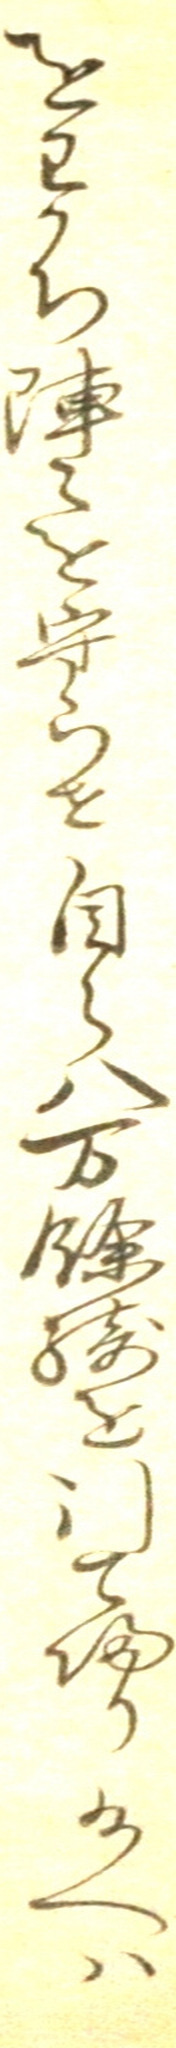をわかち陣々を守らせ自ら八万余騎を引て帰り給へは
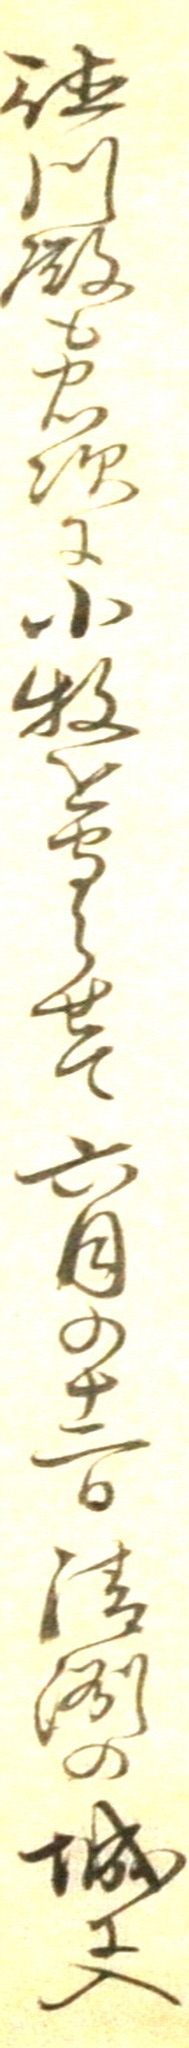徳川殿も忠次に小牧を守らせて六月の十二日清洲の城に入
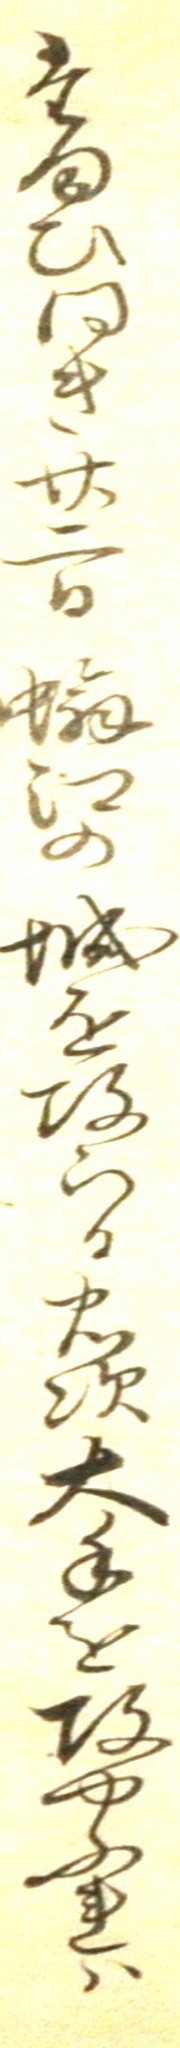たまひ同き廿二日蟹江の城を攻らる忠次大手を攻やふれは
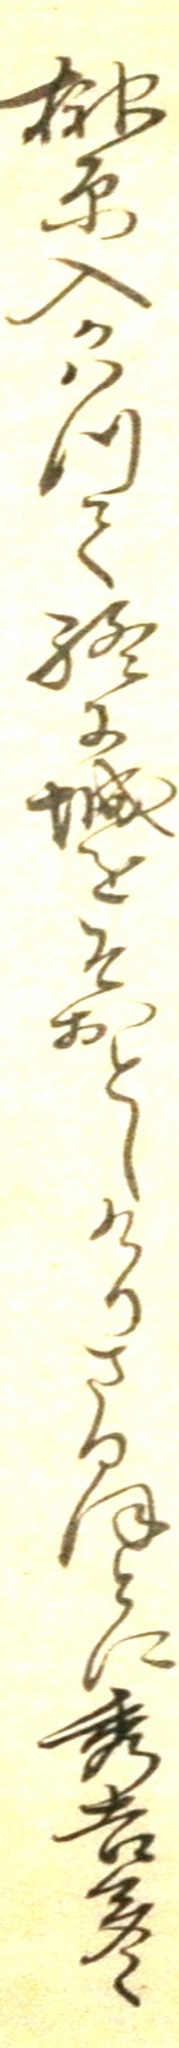榊原入かはつて終に城をそおとしけりさるほとに秀吉多く
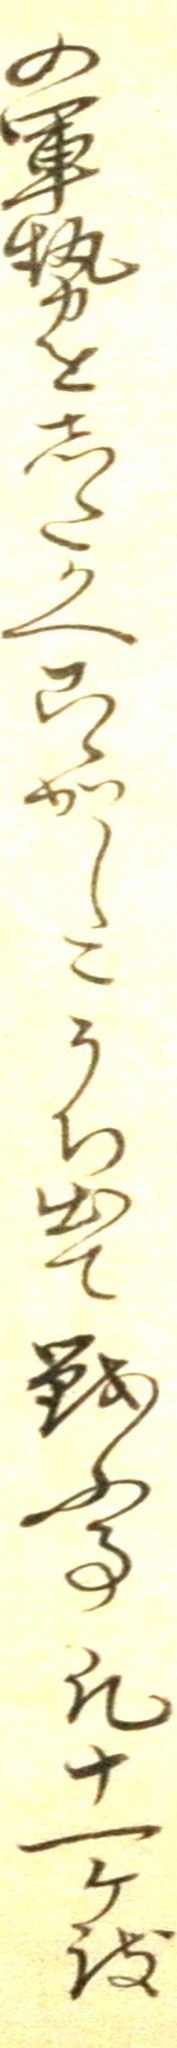の軍勢をしたかへこゝかしこうち出て戦ふ事凡十一ヶ度
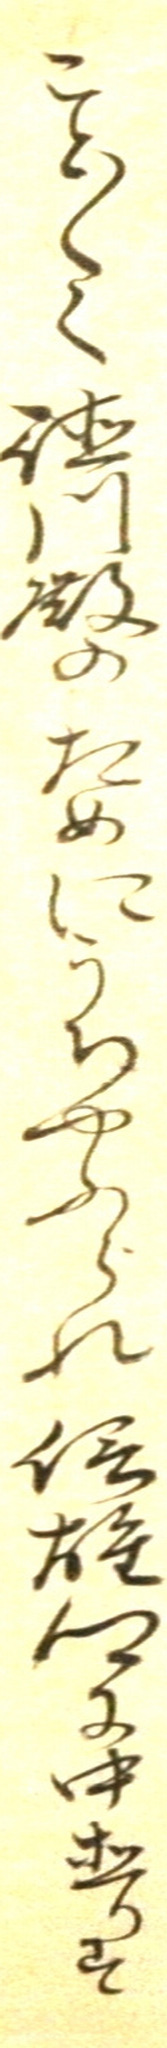こと〳〵く徳川殿のためにうちやふられ信雄卿に中直りす
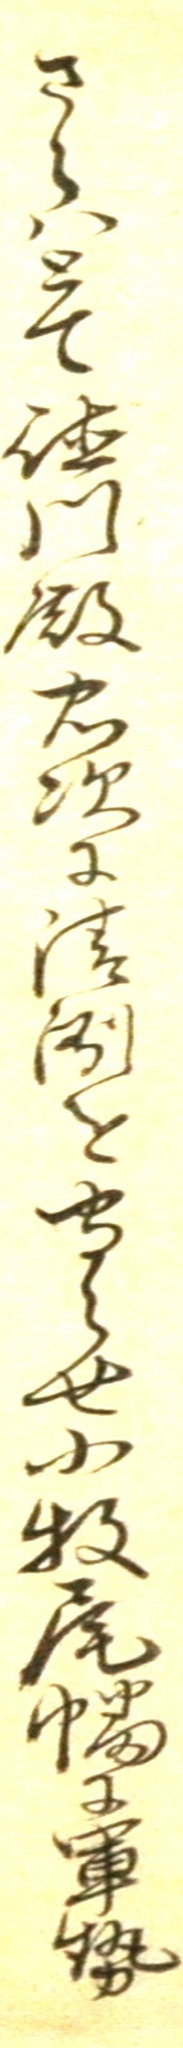さらはとて徳川殿忠次に清洲を守らせ小牧尾幡に軍勢
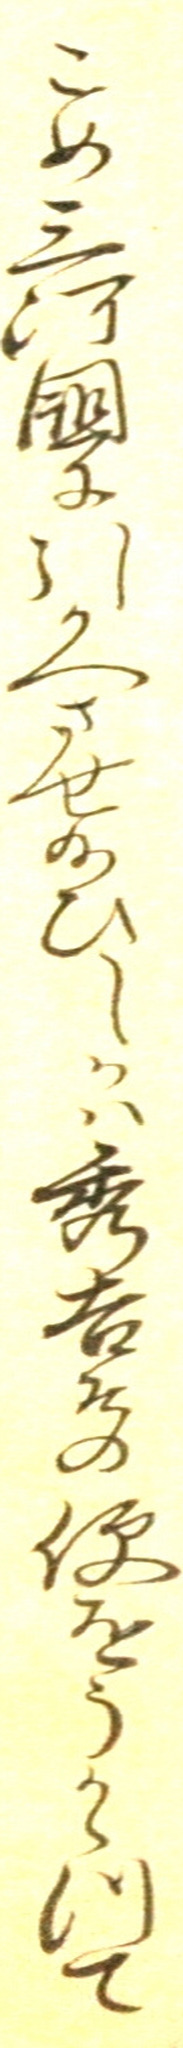こめ三河国に引かへさせ給ひしかは秀吉その使をうかゝつて

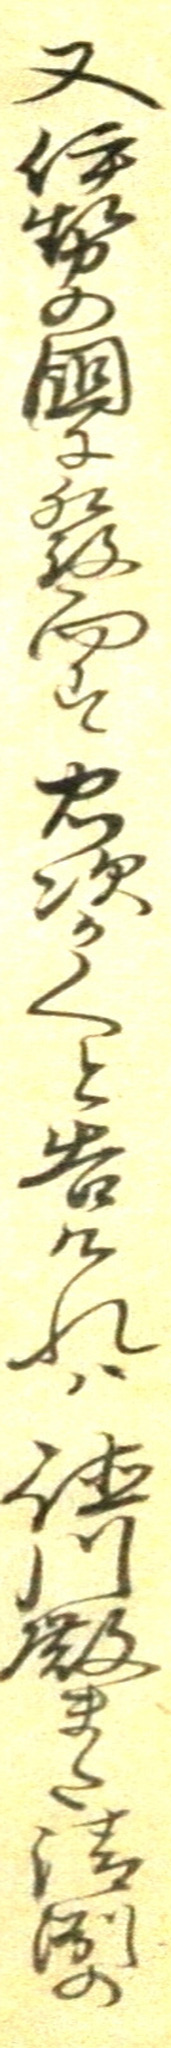又伊勢の国に発向す忠次かくと告けれは徳川殿また清洲の
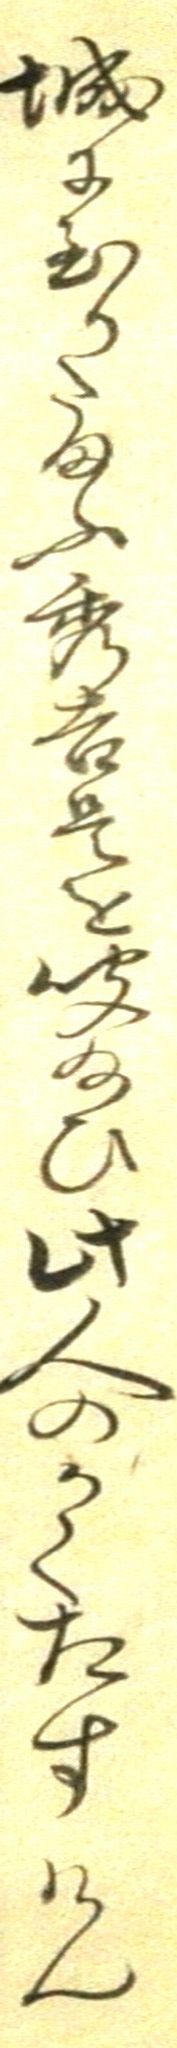城に至りたまふ秀吉是を聞給ひ此人のかくたすけん
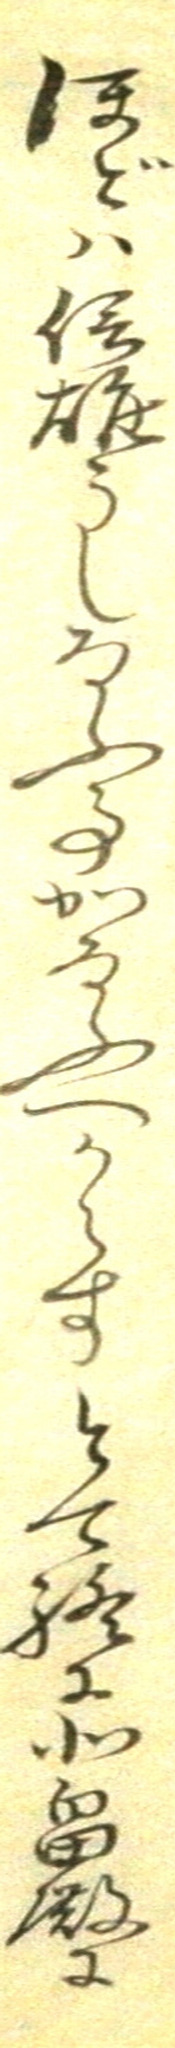ほどは信雄うしなふ事かなふへからすとて終に北畠殿に
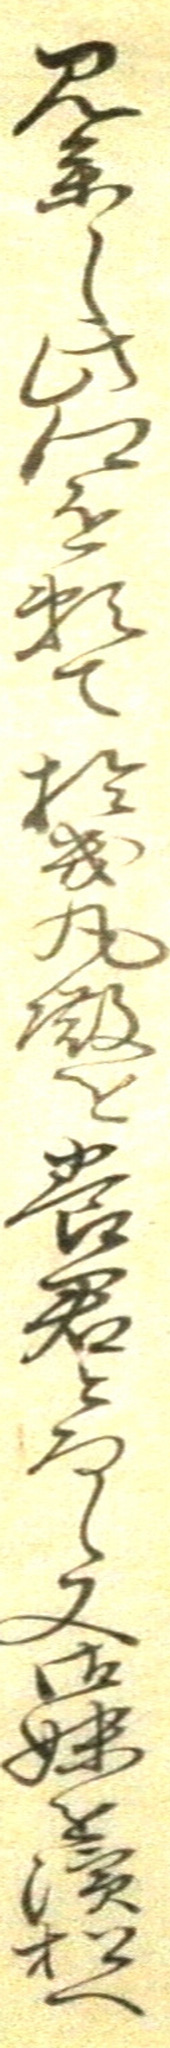見参し此卿を頼て於義丸殿を養君となし又御妹を浜松へ
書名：藩翰譜（四・上）
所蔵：伊那市立高遠町図書館・合同会社AMANE
